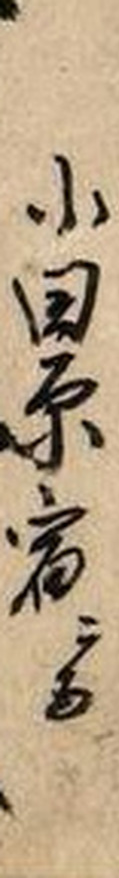九日小田原宿ニ而
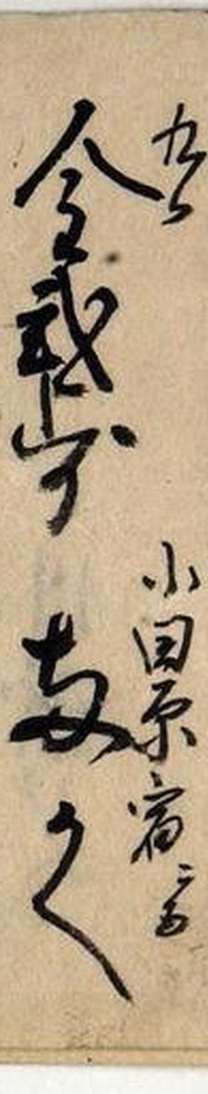金弐歩両かへ
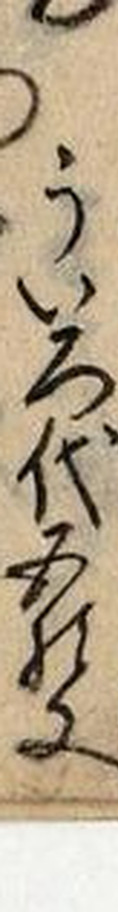ういろ代五拾文
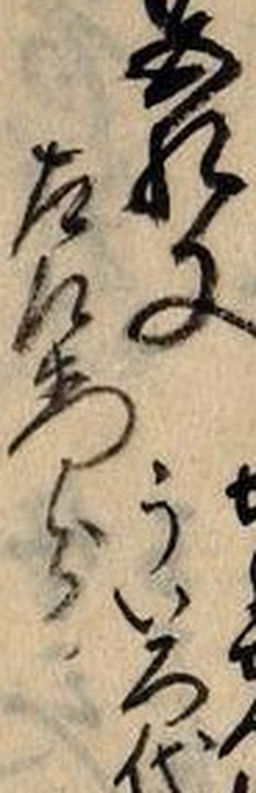太左衛門分
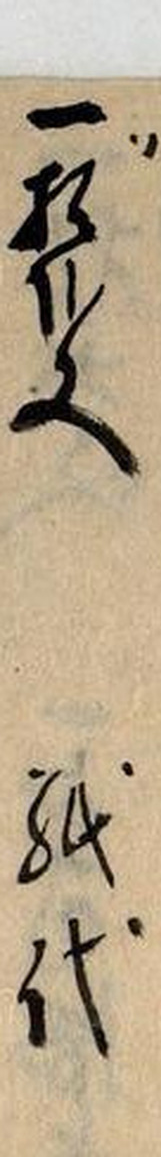一拾弐文紙代
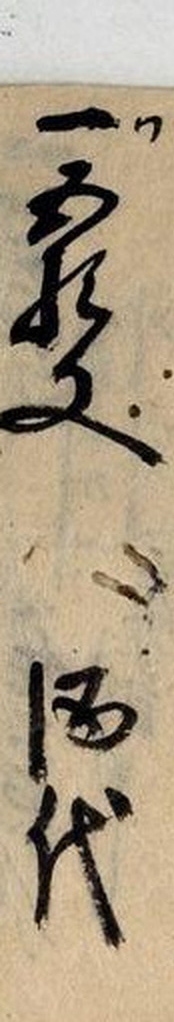一五拾文酒代
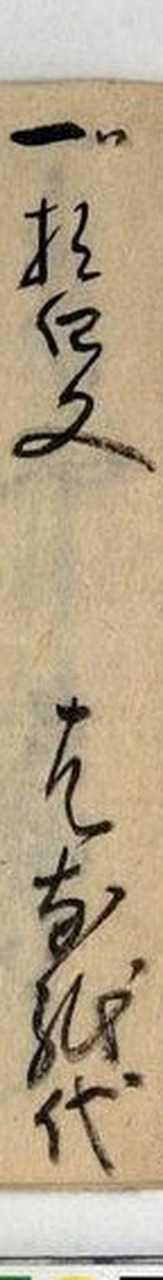一拾四文はな紙代
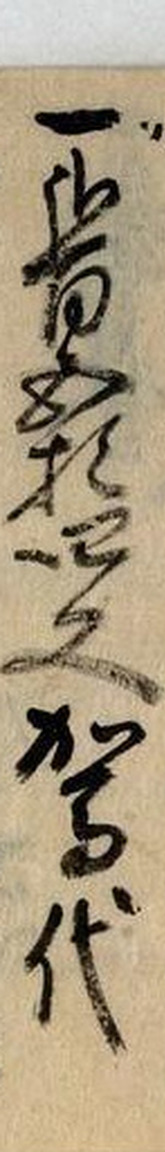一弐百五拾四文駕代
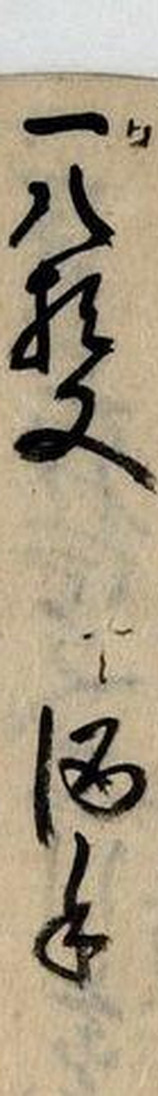一八拾文酒手
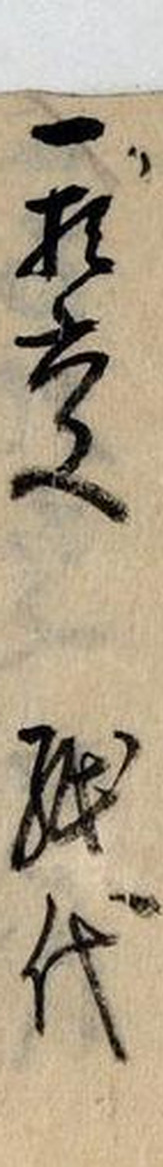一拾六文紙代
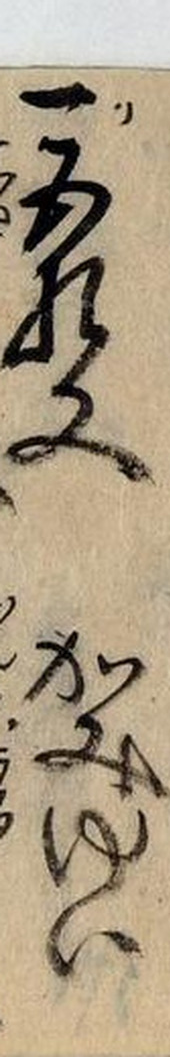一五拾文かみゆい
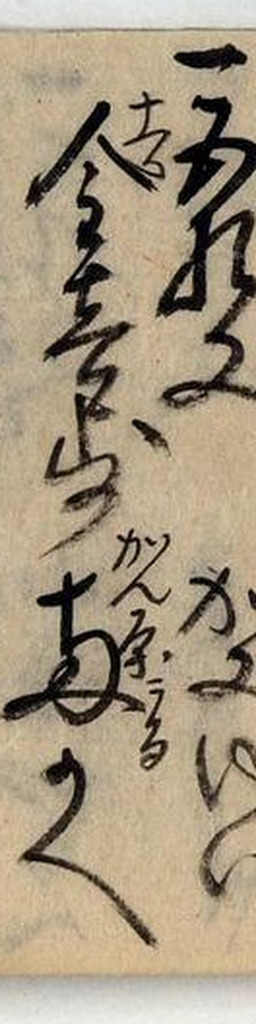金壱歩両かへ
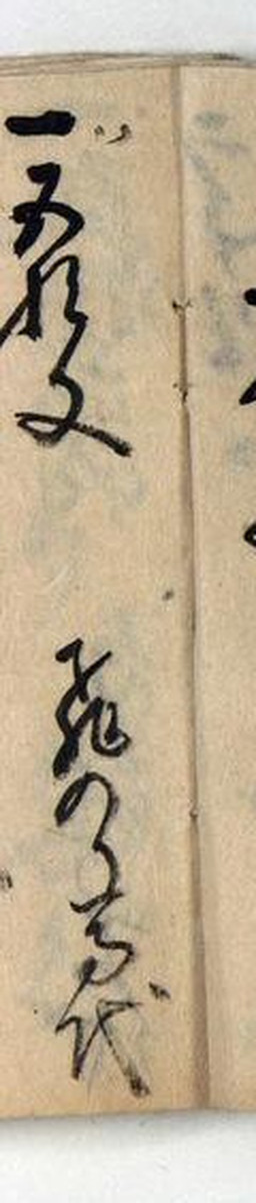一三拾弐文飛のり馬代

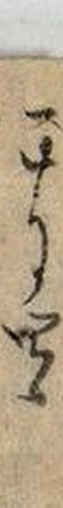正月四日
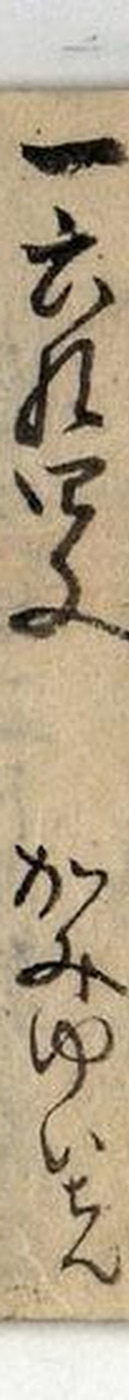一六拾四文かみゆいちん
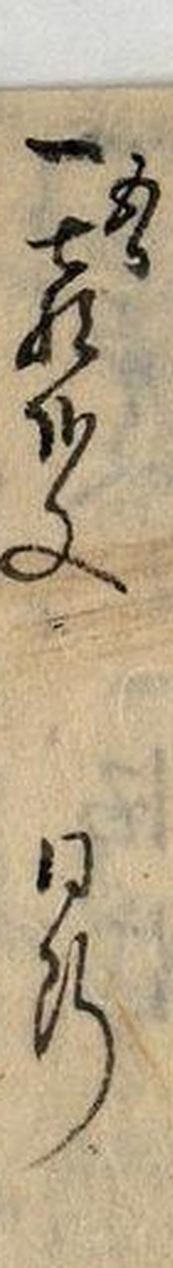一七拾弐文同断
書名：道中小遣留帳（旅）
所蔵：福井県文書館 Fukui Prefectural Archives
